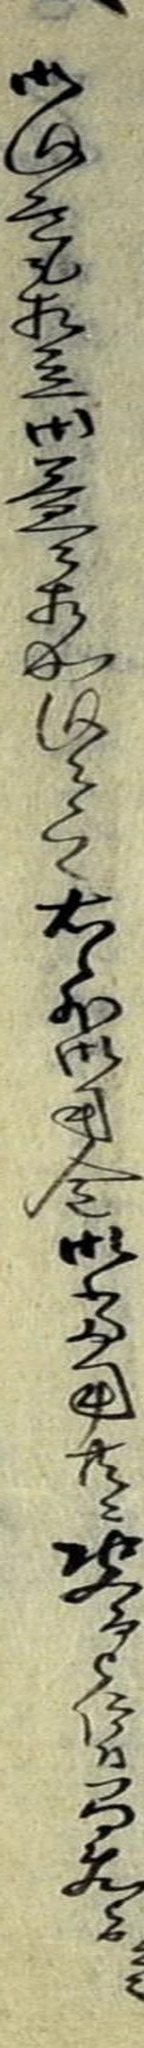御趣意も相立御益に相成趣に候はゝ右之外御用金御当用共に決而被仰付間敷旨云々
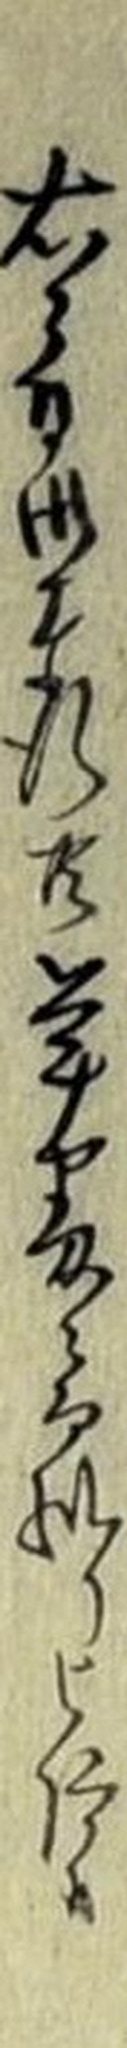右に付御奉行共年番に而掛り被仰付
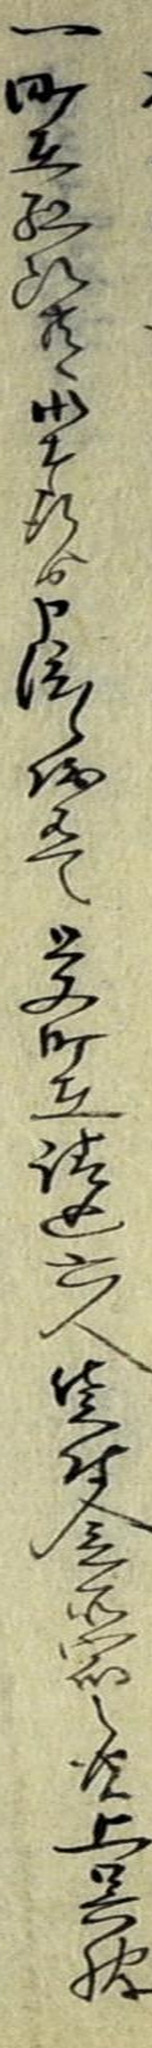一町在組頭共へ御奉行ゟ申渡候儀有之且又町在請込六人貸付会所宿之儀は上呉服
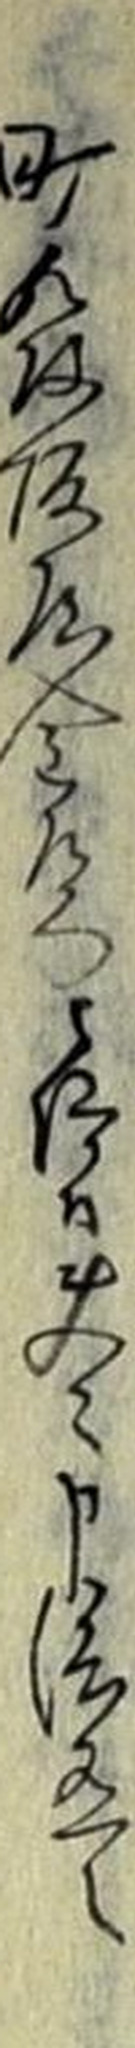町発坂屋金左衛門被仰付夫々申渡有之
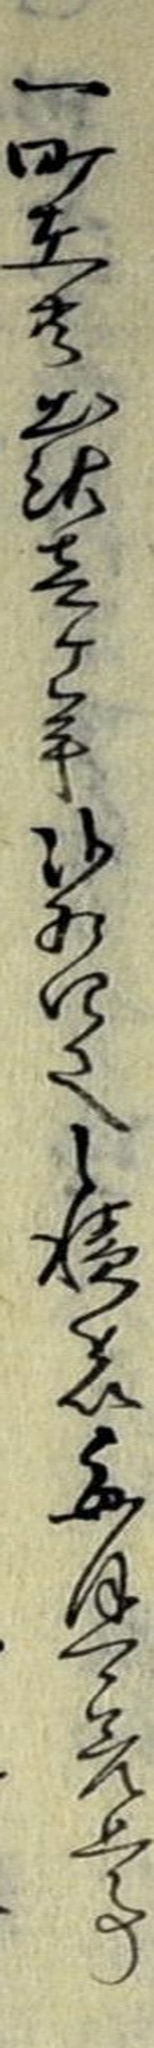一町在共出銀壱ヶ年弐拾四匁之積を以毎月可差上事
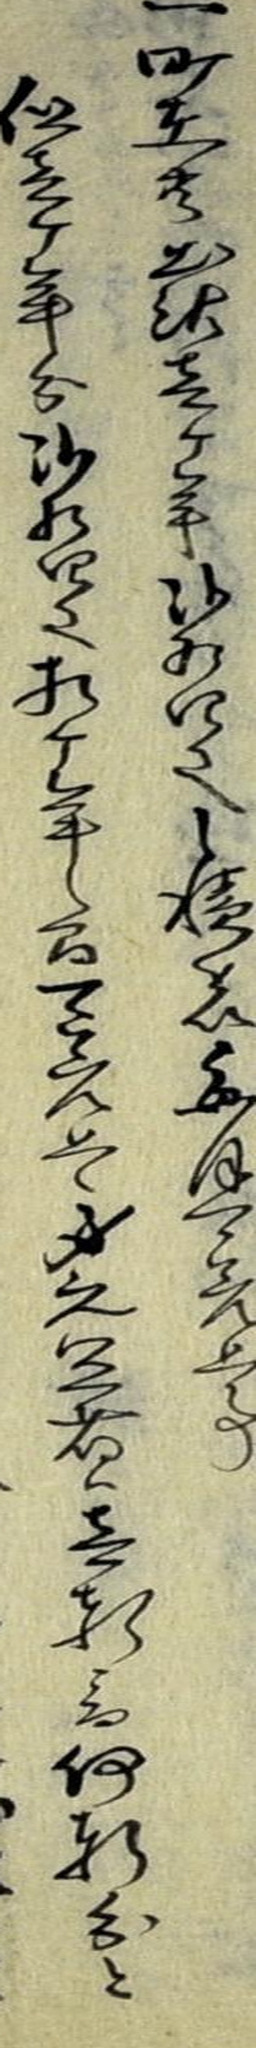但壱ヶ年分弐拾四匁拾ヶ年之間可差上候身元宜者は壱軒に而何軒分と
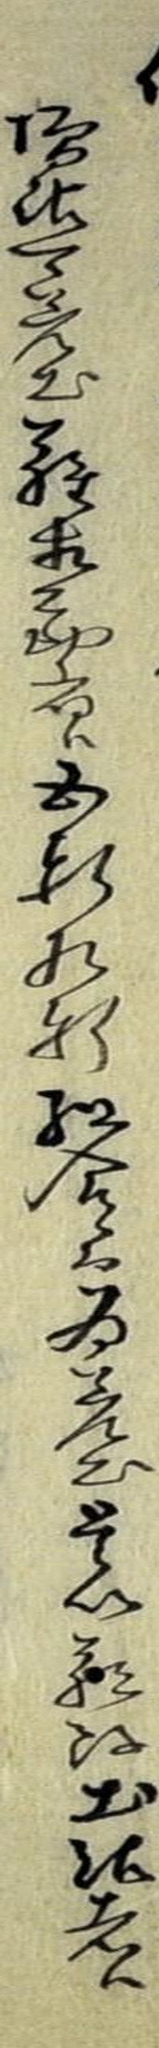増銀可差出難相勤者は五軒拾軒組合に而為差出是以難致出銀者は
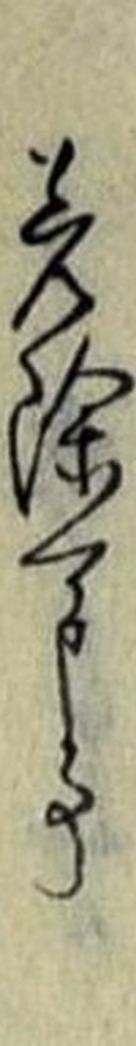差除可申事
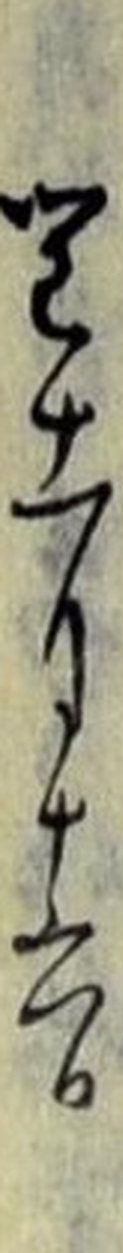閏十一月十六日
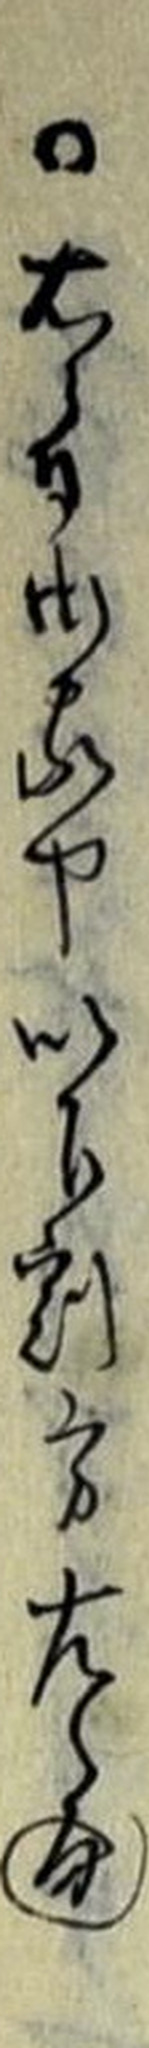〇右に付御家中以下割方左之通
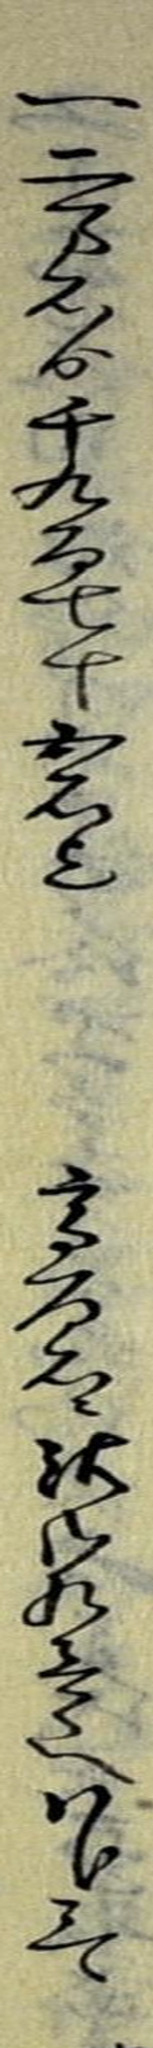一二万石ゟ千九百七十五石迄高百石に銀弐拾壱匁八分三厘中略
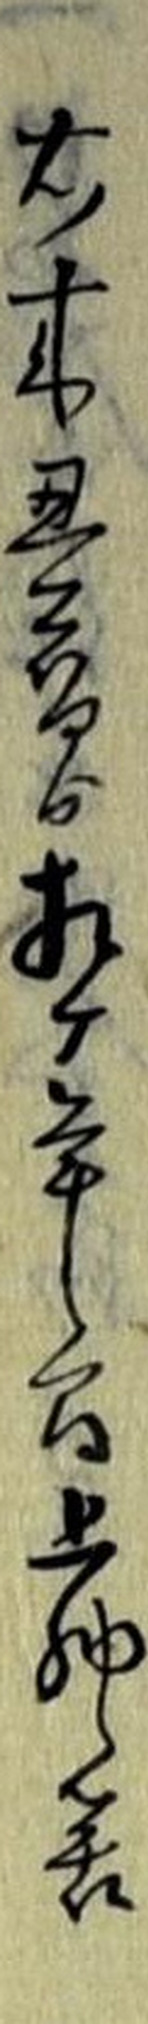右来丑暮ゟ拾ヶ年之間上納之筈
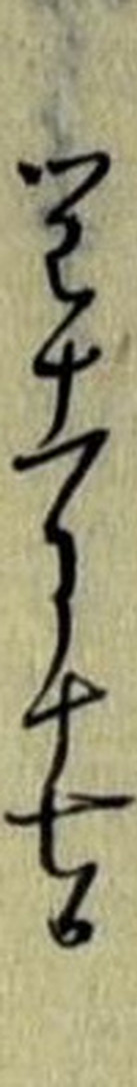閏十一月十七日
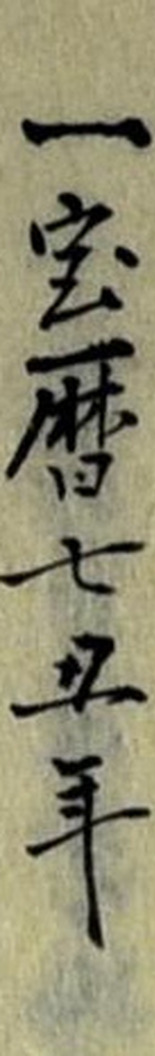一宝暦七丑年
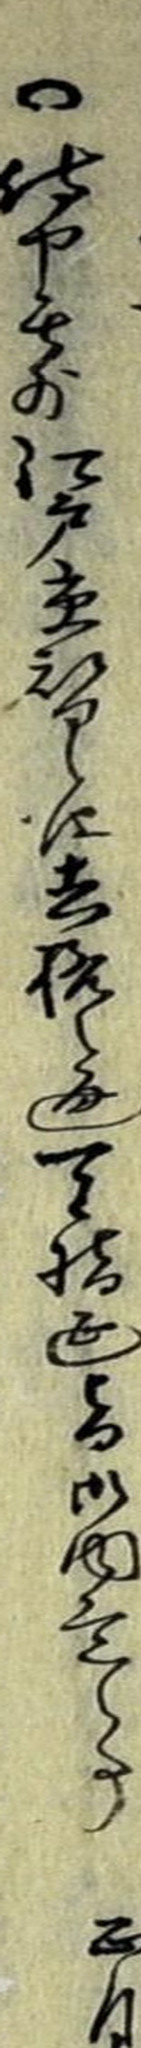〇侍中其外江戸交替之儀去格之通可被指延旨御内意之事正月晦日
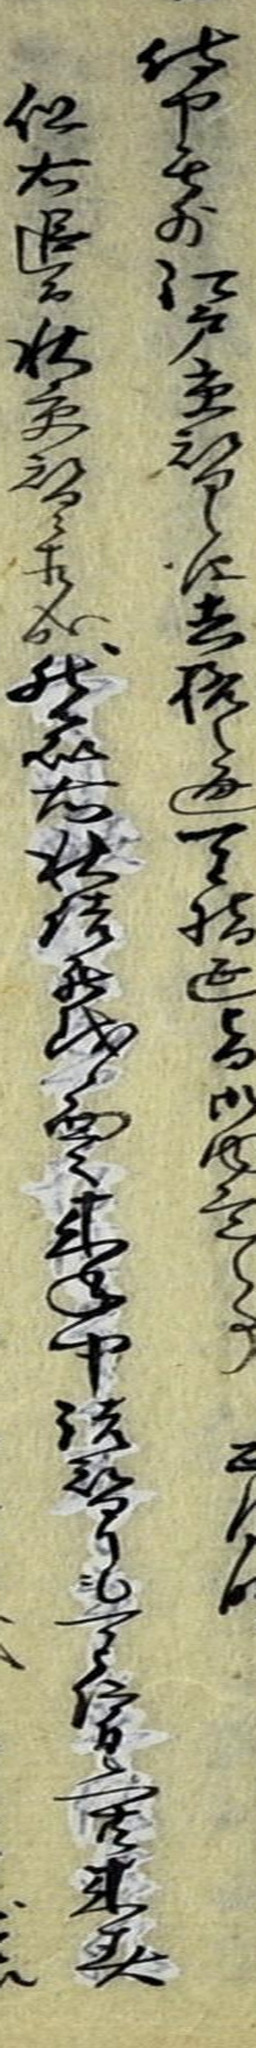但右追而秋交替に相成然処右秋詰罷越候面々来年中詰替りも可被仰付候へ共来春
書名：命令之部 二
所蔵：福井県文書館 Fukui Prefectural Archives
